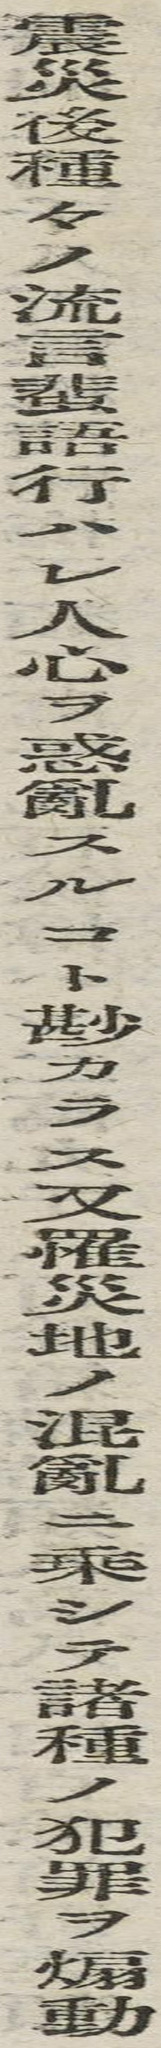震災後種々ノ流言飛語行ハレ人心ヲ惑乱スルコト尠カラス又罹災地ノ混乱ニ乗シテ諸種ノ犯罪ヲ扇動
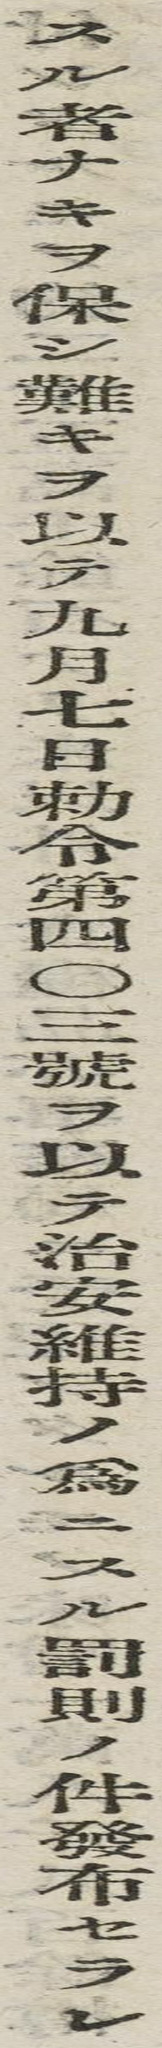スル者ナキヲ保シ難キヲ以テ九月七日勅令第四〇三号ヲ以テ治安維持ノ為ニスル罰則ノ件発布セラレ
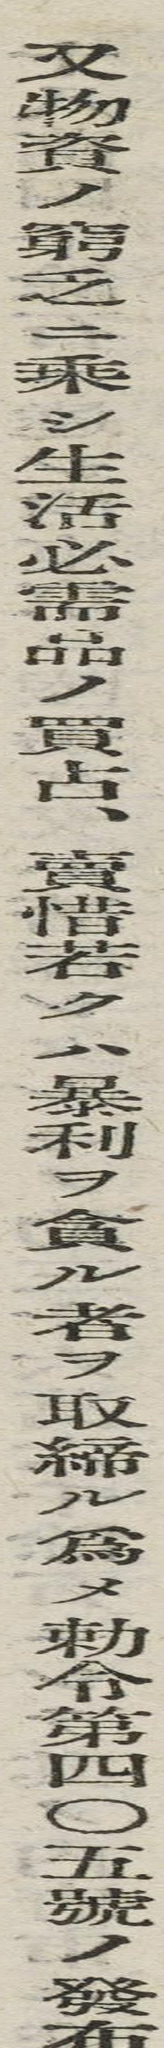又物資ノ窮乏ニ乗シ生活必需品ノ買占、売惜若クハ暴利ヲ貪ル者ヲ取締ル為メ勅令第四〇五号ノ発布
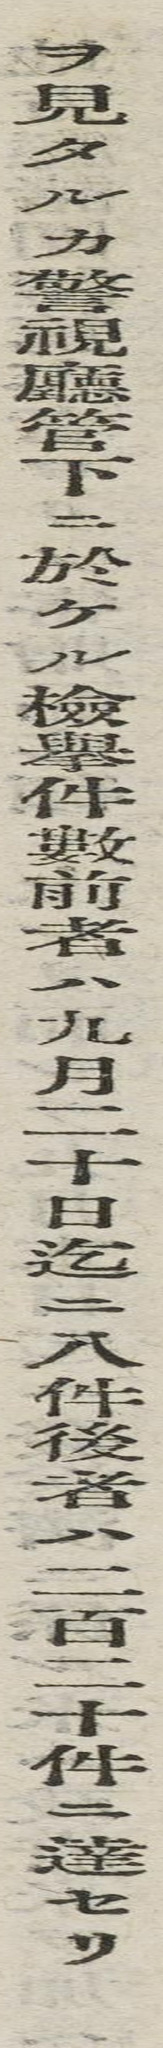ヲ見タルカ警視庁管下ニ於ケル検挙件数前者ハ九月二十日迄ニ八件後者ハ二百二十件ニ達セリ
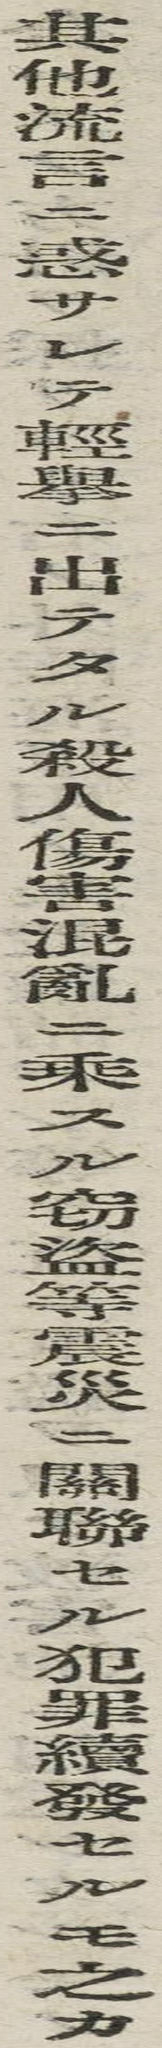其他流言ニ惑サレテ軽挙ニ出テタル殺人傷害混乱ニ乗スル窃盗等震災ニ関連セル犯罪続発セルモ之カ
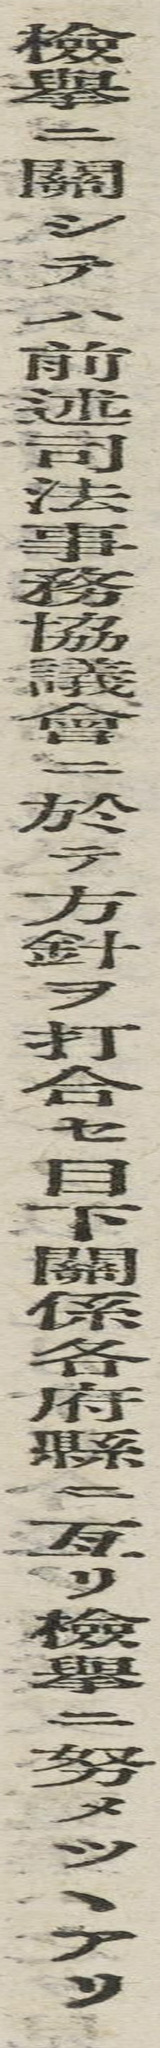検挙ニ関シテハ前述司法事務協議会ニ於テ方針ヲ打合セ目下関係各府県ニ互リ検挙ニ努メツヽアリ
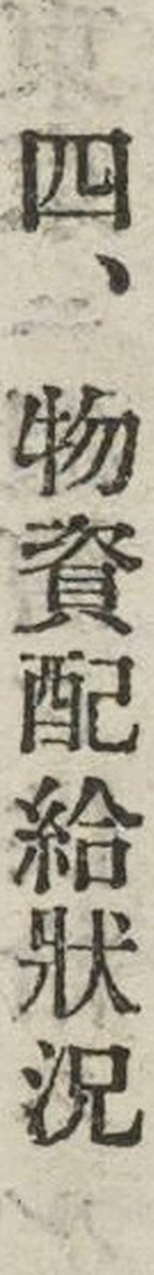四、物資配給情況
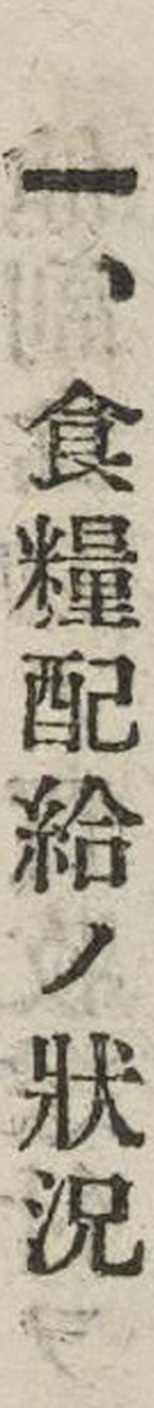一、食糧配給ノ状況
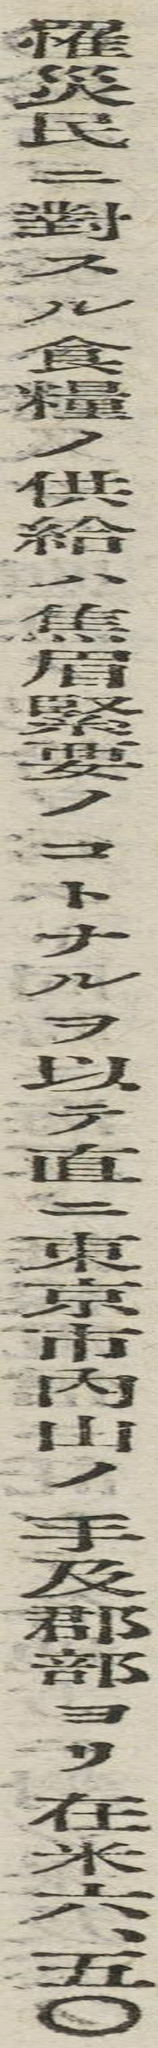罹災民ニ対スル食糧ノ供給ハ焦眉緊要ノコトナルヲ以テ直ニ東京市内山ノ手及郡部ヨリ在米六、、五〇

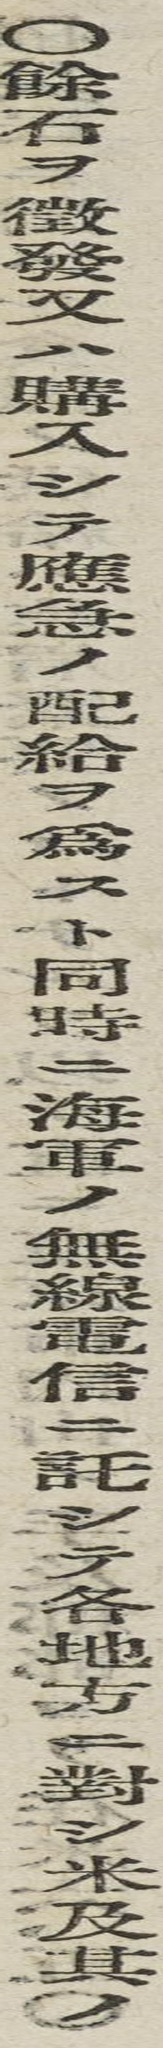〇余石ヲ徴発又ハ購入シテ応急ノ配給ヲ為スト同時ニ海軍ノ無線電信ニ託シテ各地方ニ対シ米及其ノ
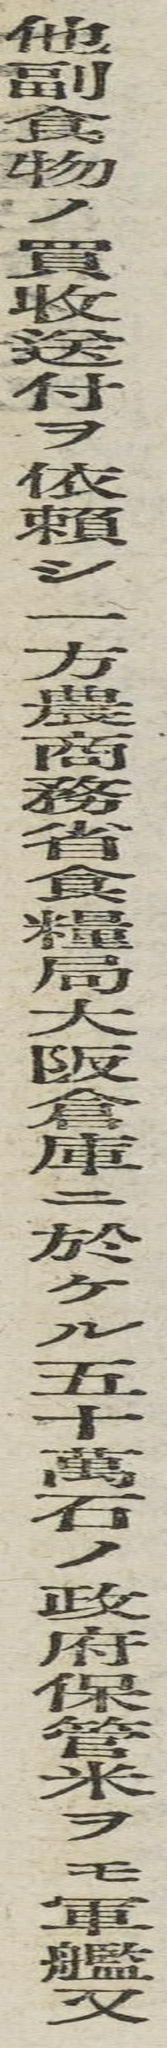他副食物ノ買収送付ヲ依頼シ一方農務省食糧局大阪倉庫ニ於ケル五十万石ノ政府保管米ヲモ軍艦又
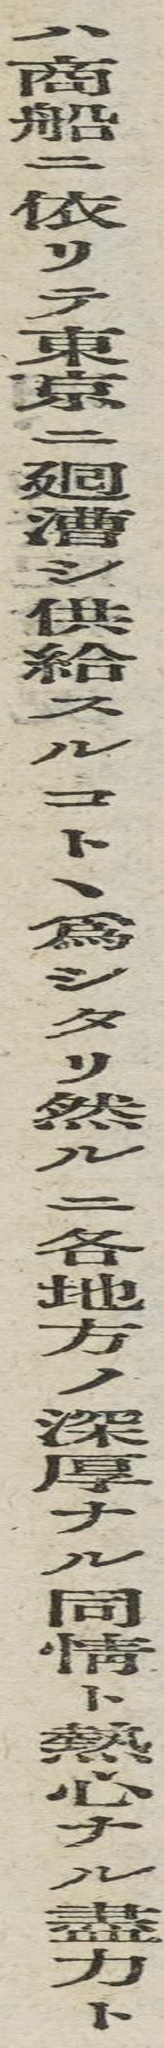ハ商船ニ依リテ東京ニ廻漕シ供給スルコトヽ為シタリ然ルニ各地方ノ深厚ナル同情ト熱心ナル尽力ト
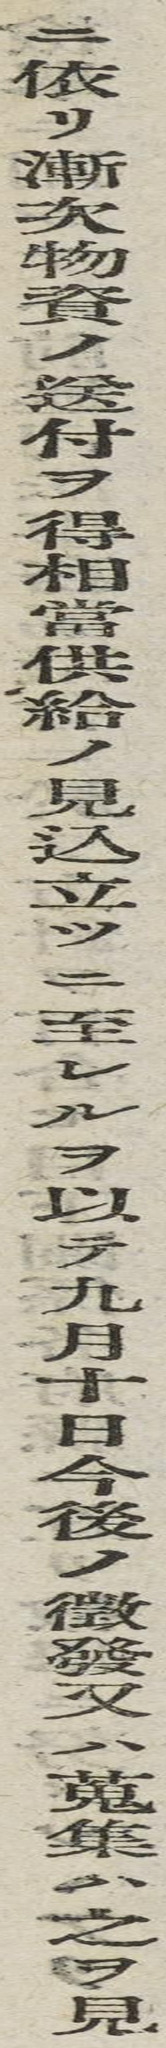ニ依リ漸次物資ノ送付ヲ得相当供給ノ見込立ツニ至レルヲ以テ九月十日今後ノ徴発又ハ蒐集ハ之ヲ見
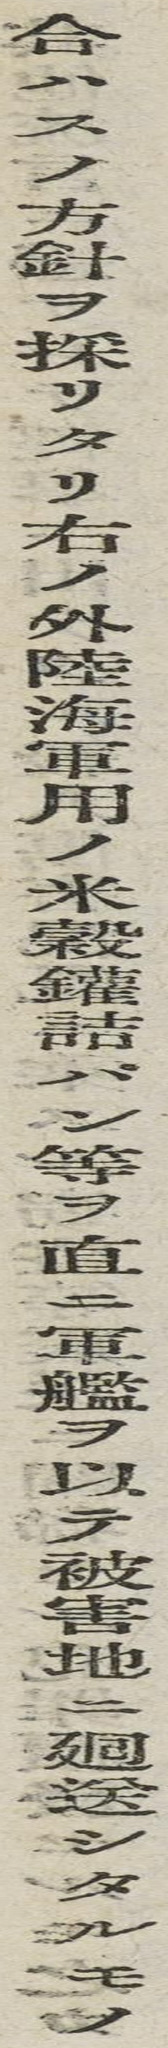合ハスノ方針ヲ採リタリ右ノ外陸海軍用ノ米穀缶詰パン等ヲ直ニ軍艦ヲ以テ被害地ニ廻送シタルモノ
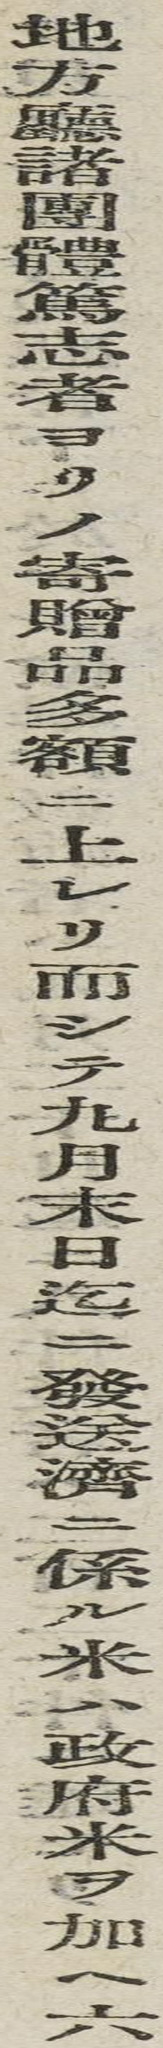地方庁諸団体篤志者ヨリノ寄贈品多額ニ上レリ而シテ九月末日迄ニ発送済ニ係ル米ハ政府米ヲ加ヘ六
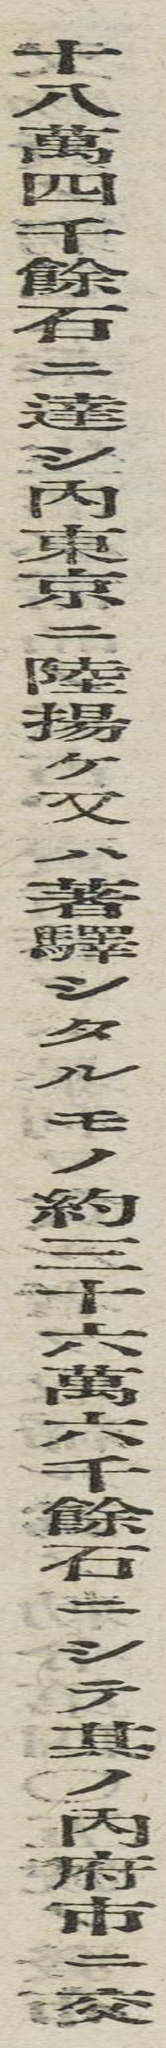十八万四千余石ニ達シ内東京ニ陸揚ケ又ハ著駅シタルモノ約三十六万六千余石ニシテ其ノ内府市ニ交
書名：震災被害状況並救護施設概要
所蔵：東京大学地震研究所図書室 Earthquake Research Institute Library, The University of Tokyo, JAPAN
